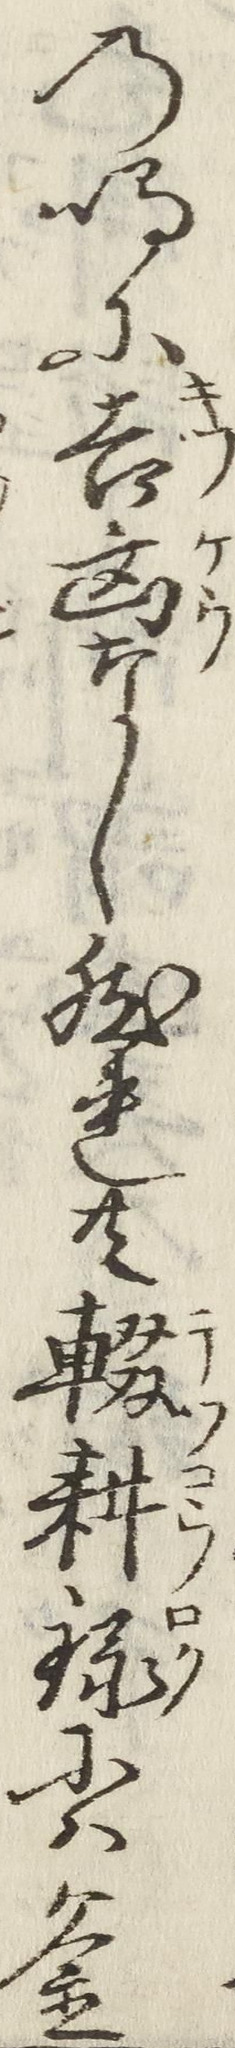の鳴に吉凶なし然れ共輟耕録には釜
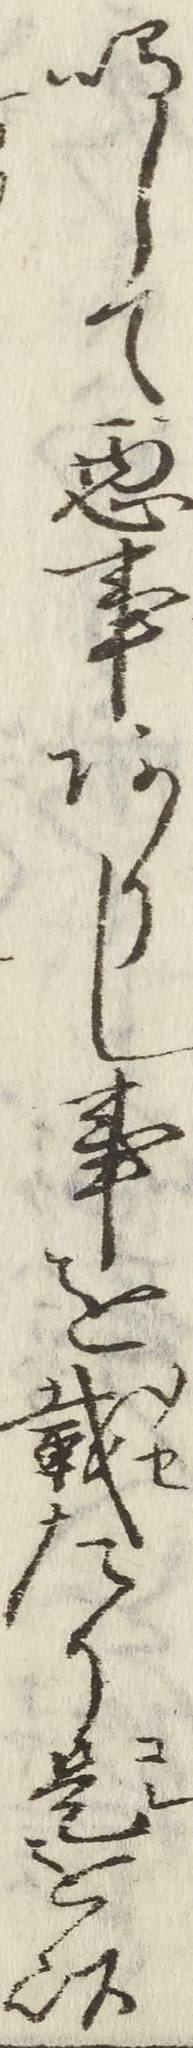鳴して悪事ありし事を載たり是を以
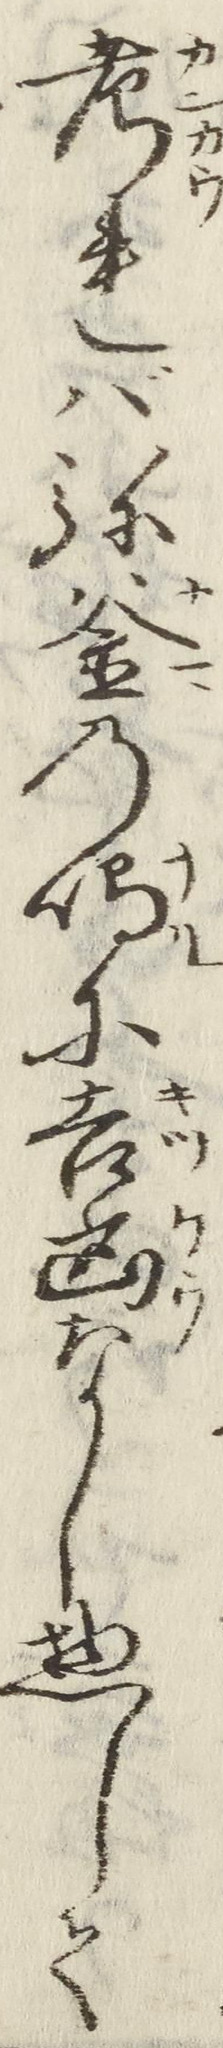考れば弥釜の鳴に吉凶なし惣して
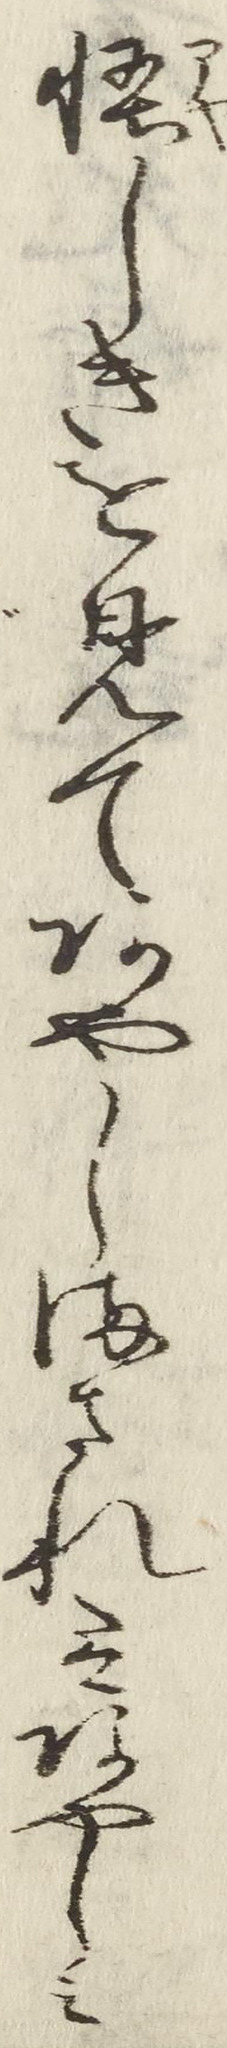怪しきを見てあやしまされはあやしみ
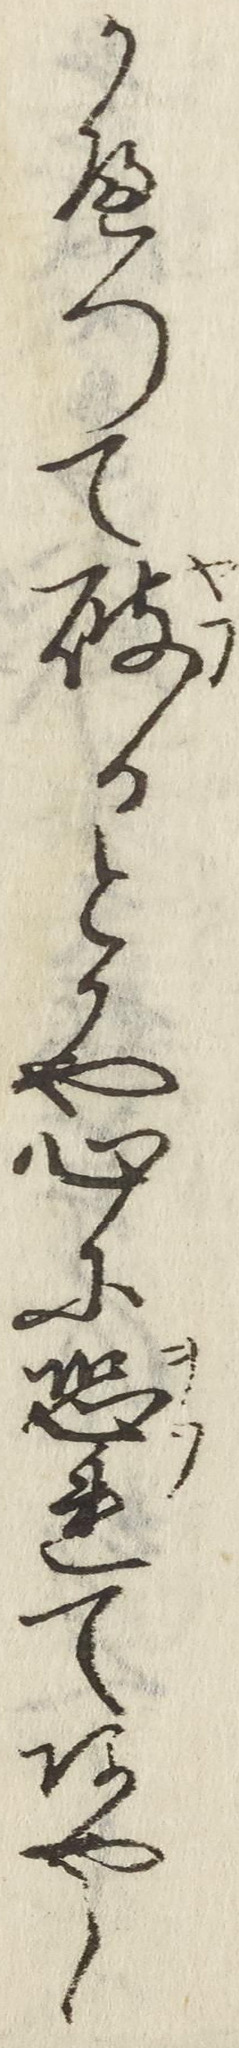かへつて破るとかや心に恐れてあやし

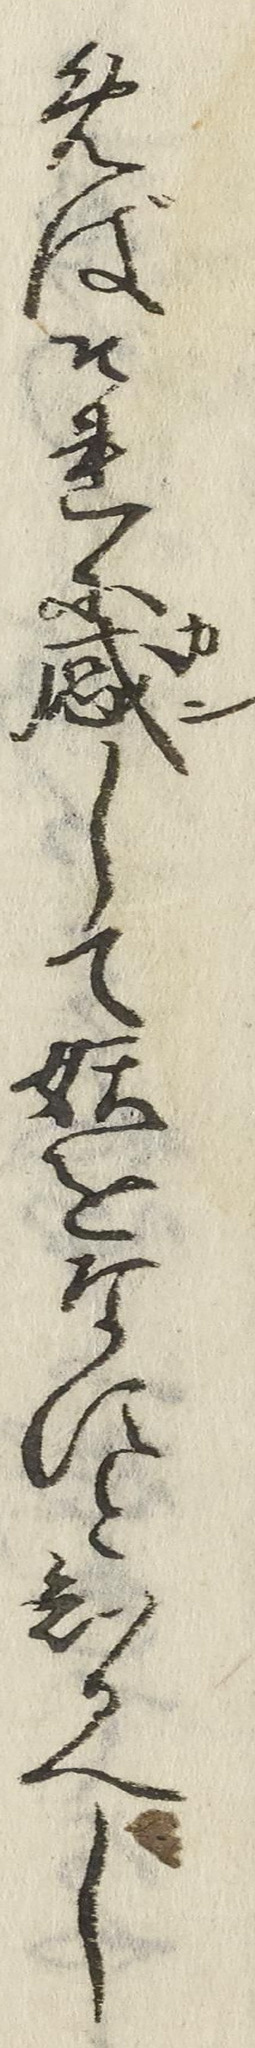めばそれに感して妖をなすと知るへし
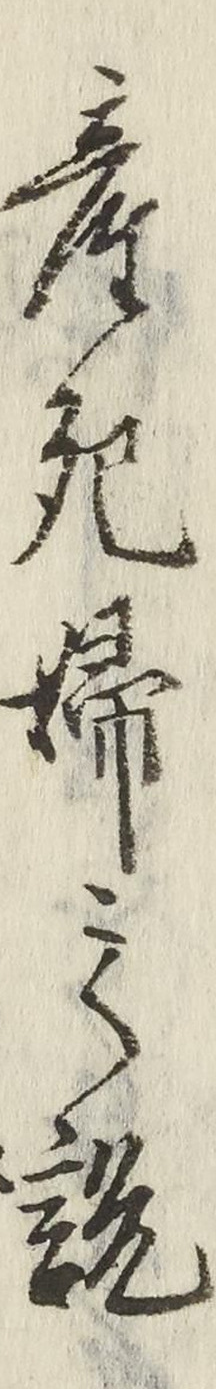産死婦の説
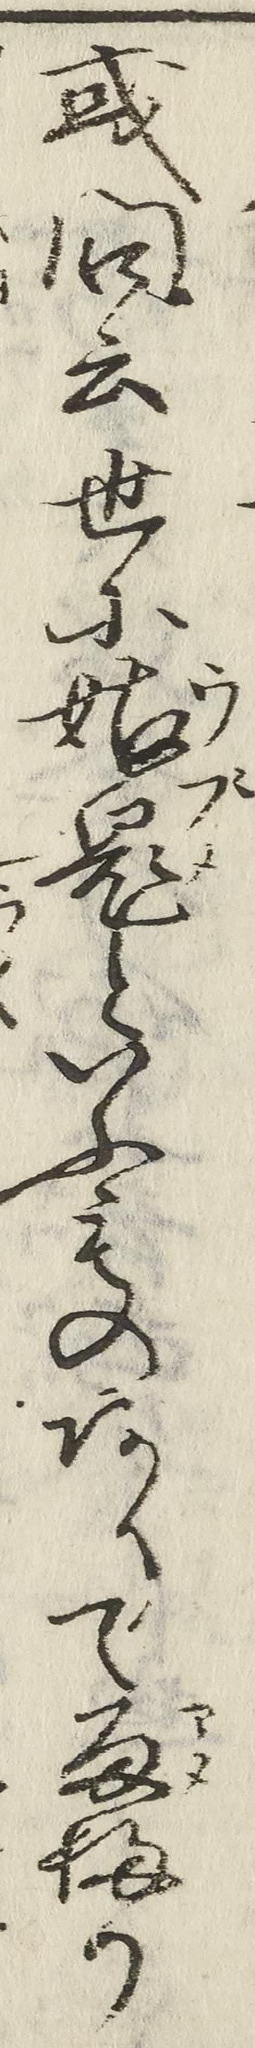或問云世に姑鬼といふものありて雨ふり
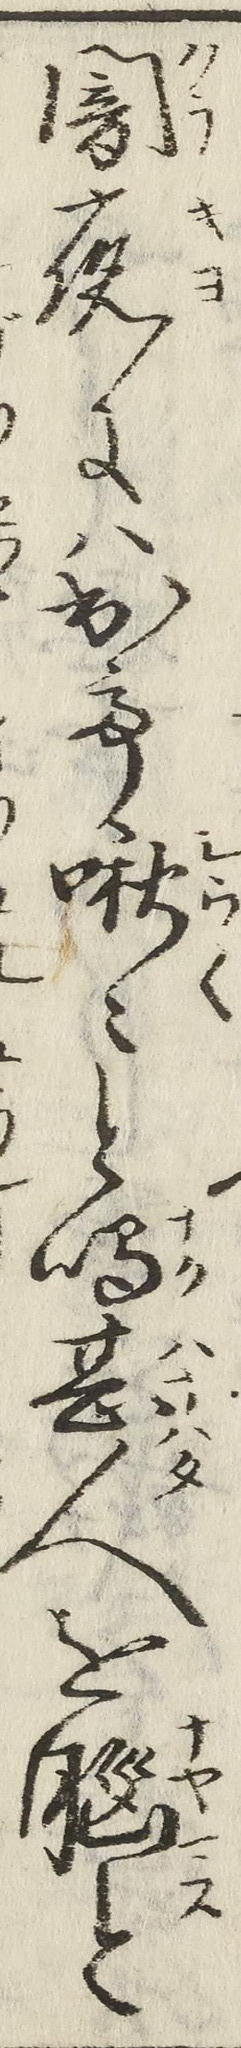闇夜には出て啾々と鳴甚人を脳と
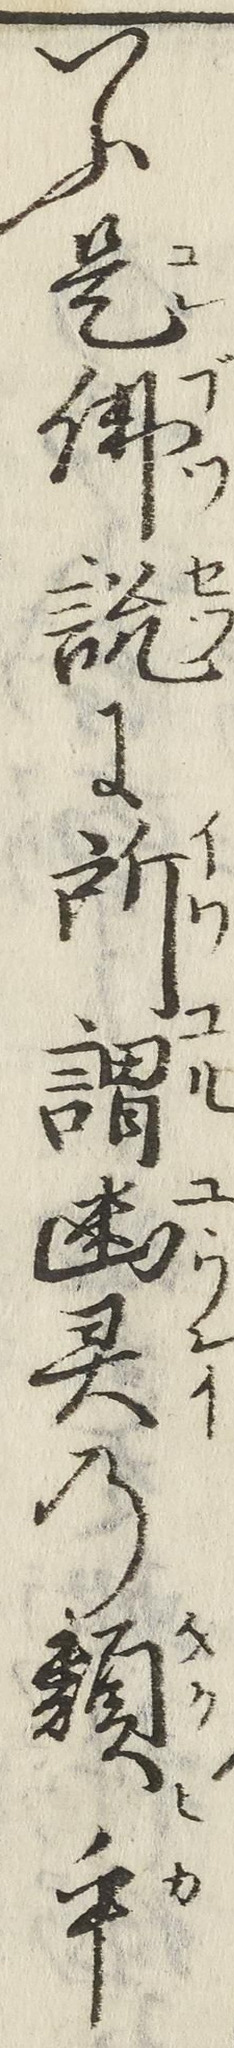いふ是仏説に所謂幽霊の類乎
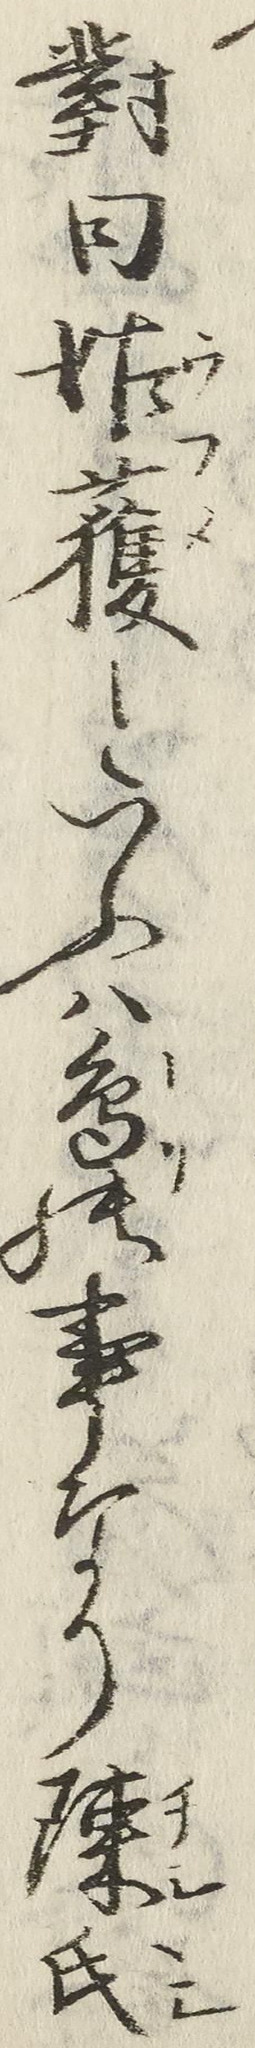対曰姑獲といふは鳥の事なり陳氏
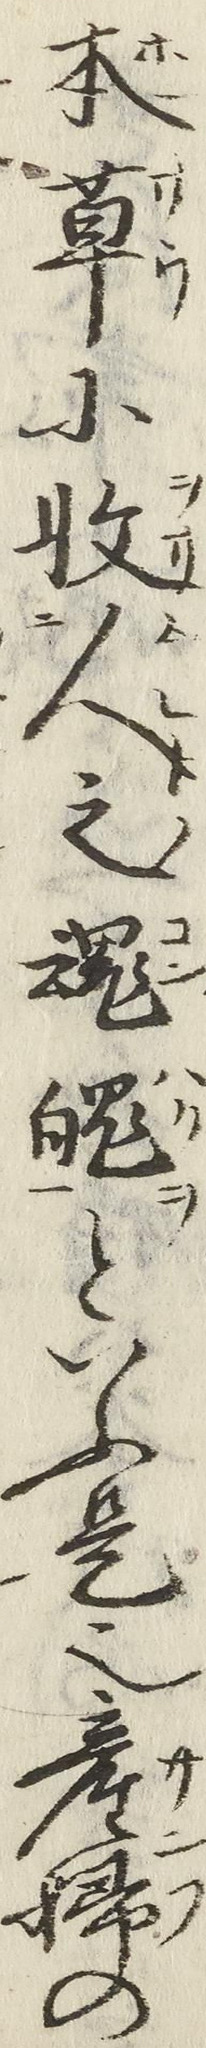本草に収人之魂魄といふ是也産婦の
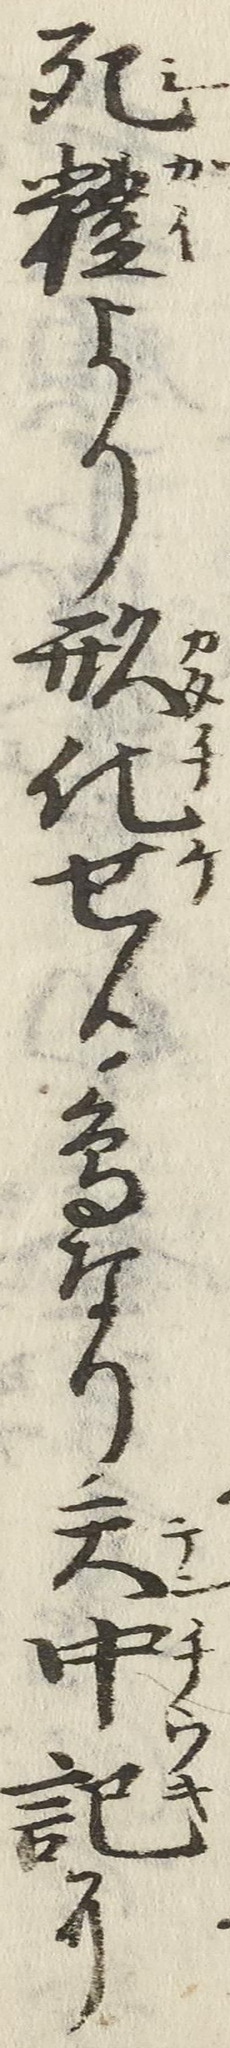死骸より形化せる鳥なり天中記に
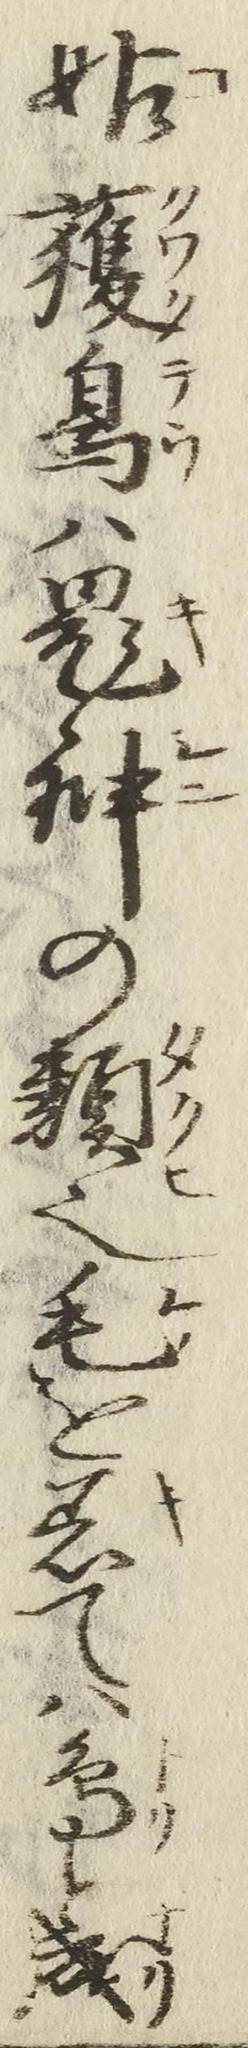姑獲鳥は鬼神の類也毛を忌ては鳥と成
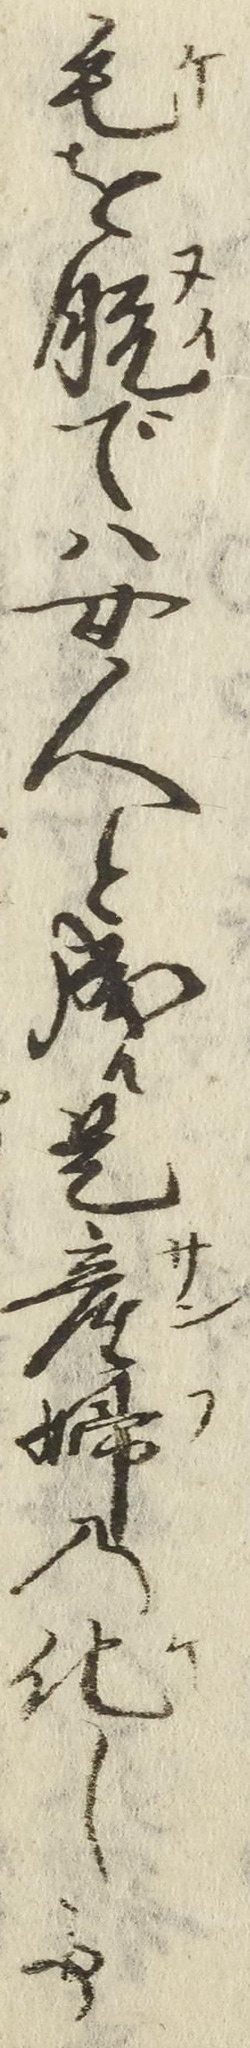毛を脱では女人と成ル是産婦の化して
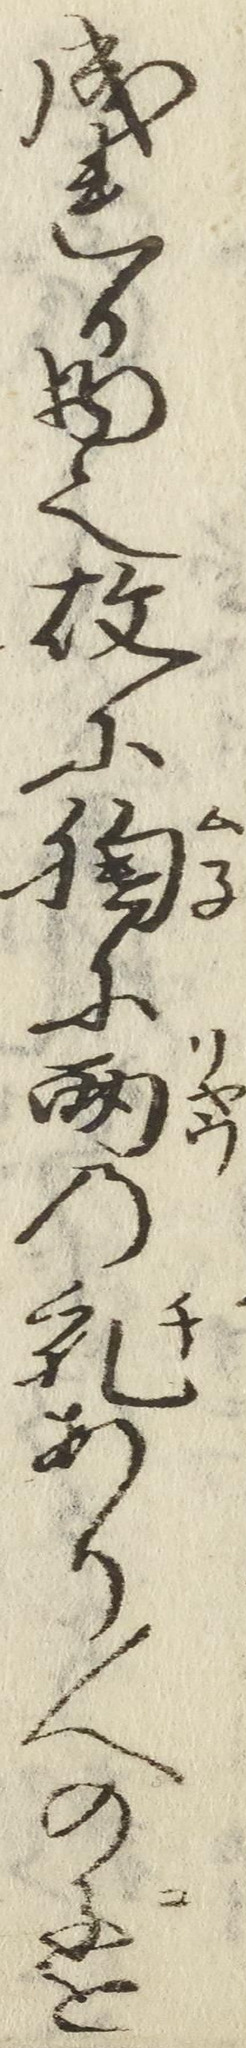成れる物也故に胸に両の乳あり人の子を
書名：天地或問珍　地
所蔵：東京大学地震研究所図書室 Earthquake Research Institute Library, The University of Tokyo, JAPAN
